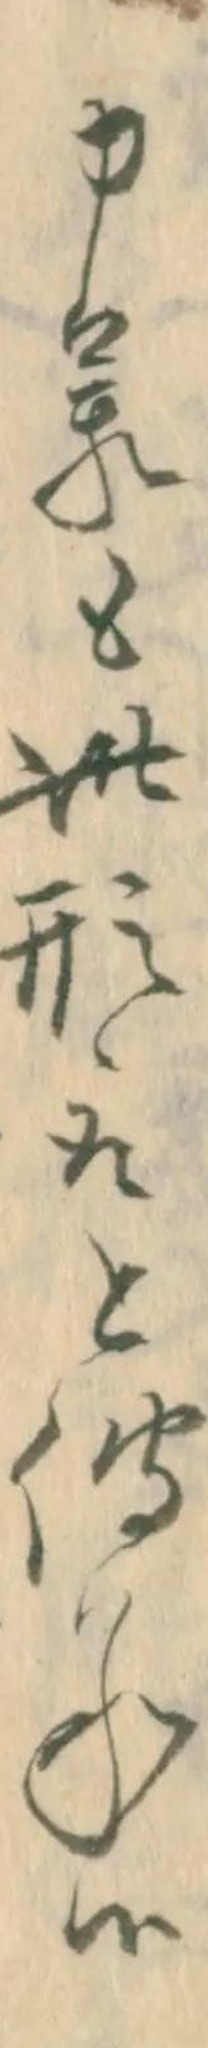申義も此形取と伝承候
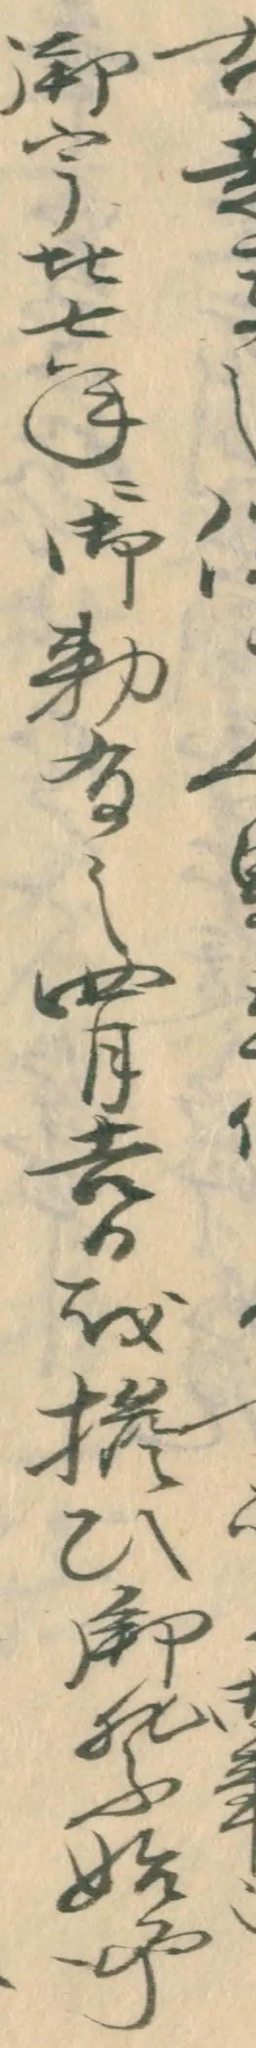御宇廿七年ニ御勅有之四月吉日を担ひ御祭始而行
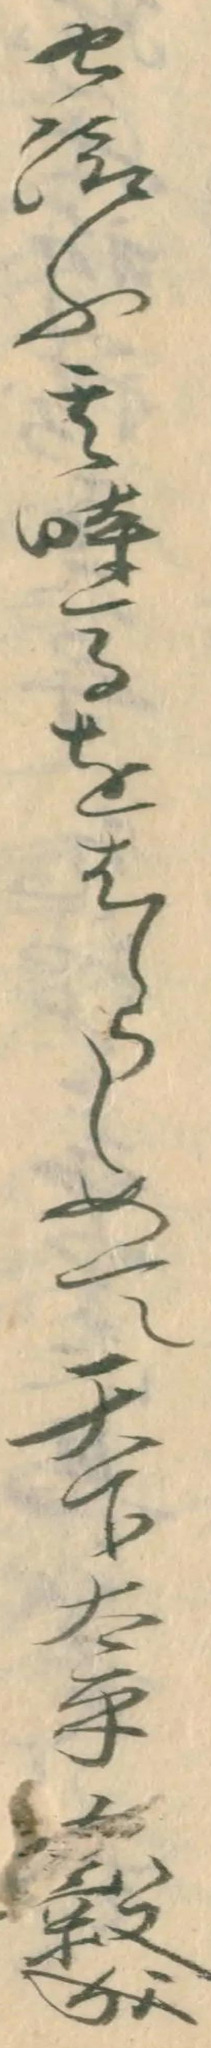セ給ふ其時馬をはしらしめて天下太平五穀成

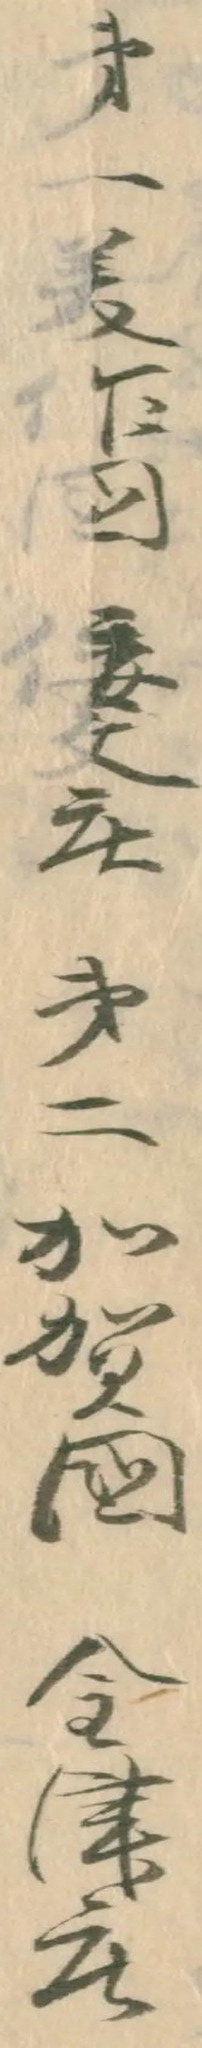第一美作国倭文庄第二加賀国金津庄

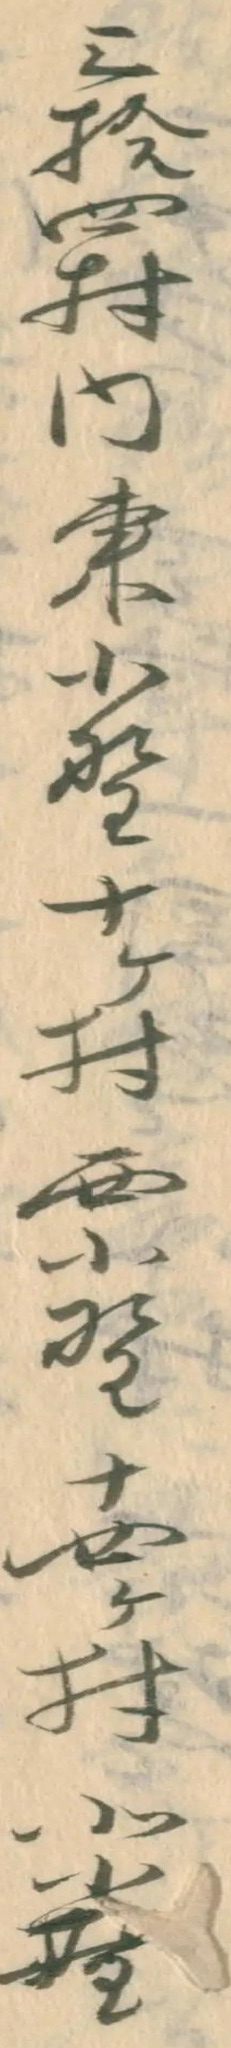三拾四村内東小野十ケ村西小野十四ケ村北小野
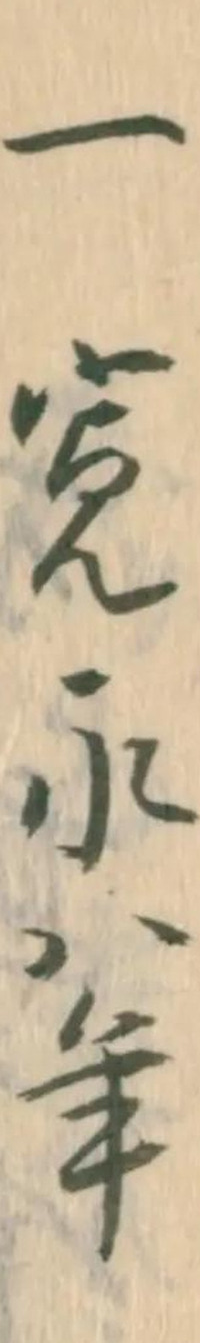一寛永八年
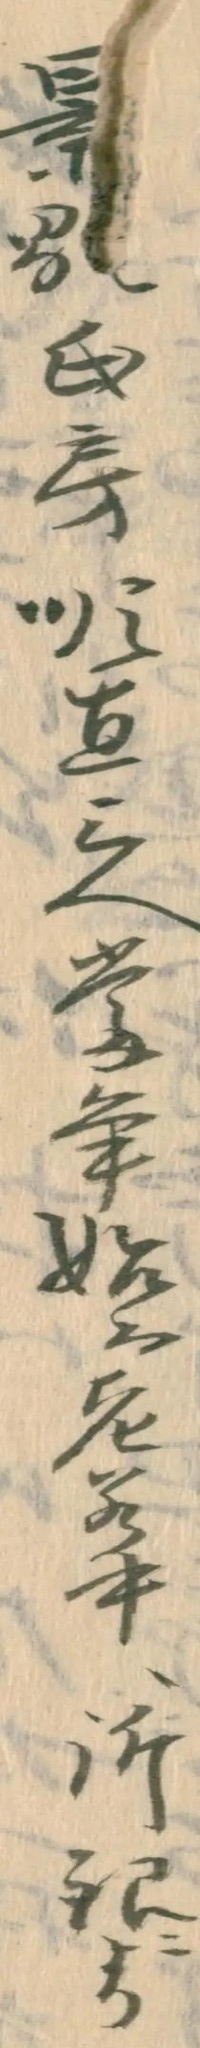影顕氏房順直三人当年始而老若中へ訴詔ニより
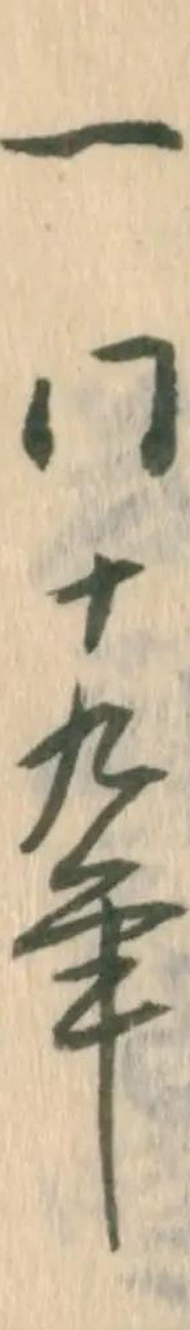一同十九年
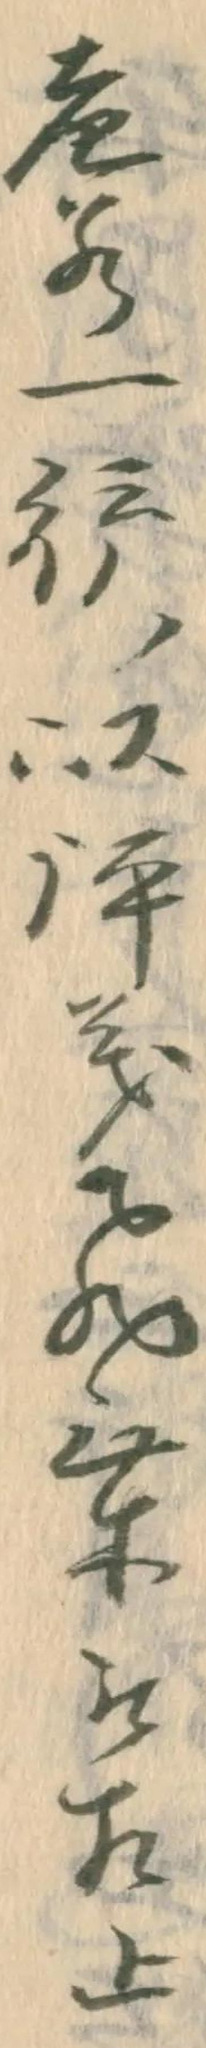老若一統ノ以評義飛乗被相止
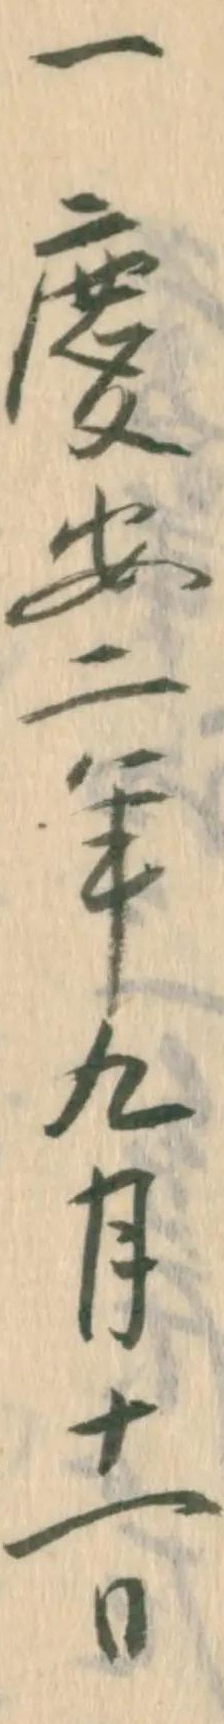一慶安二年九月十一日
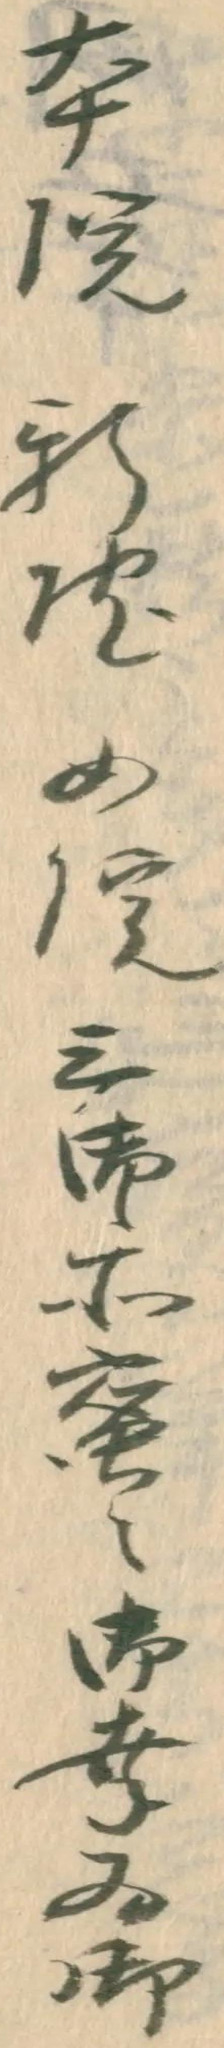本院新院女院三御所蜜々御幸為御
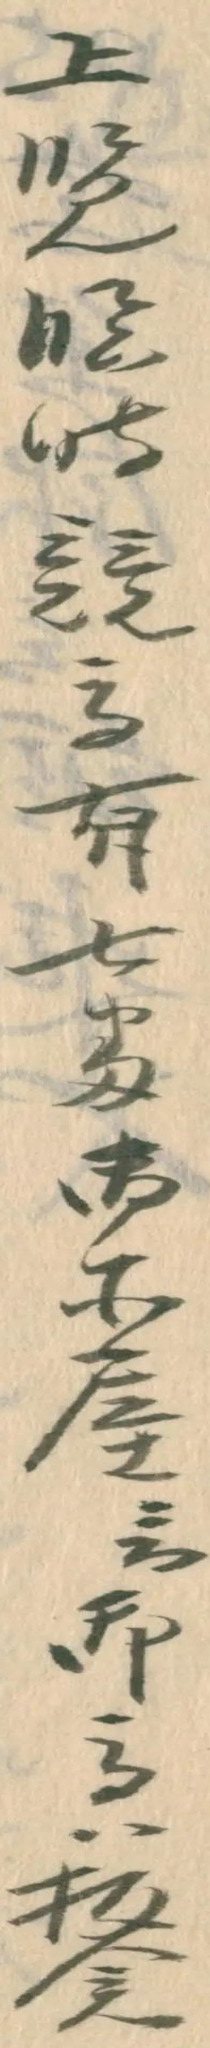上覧臨時競馬有七番御所屋ニ而御馬ハ板倉
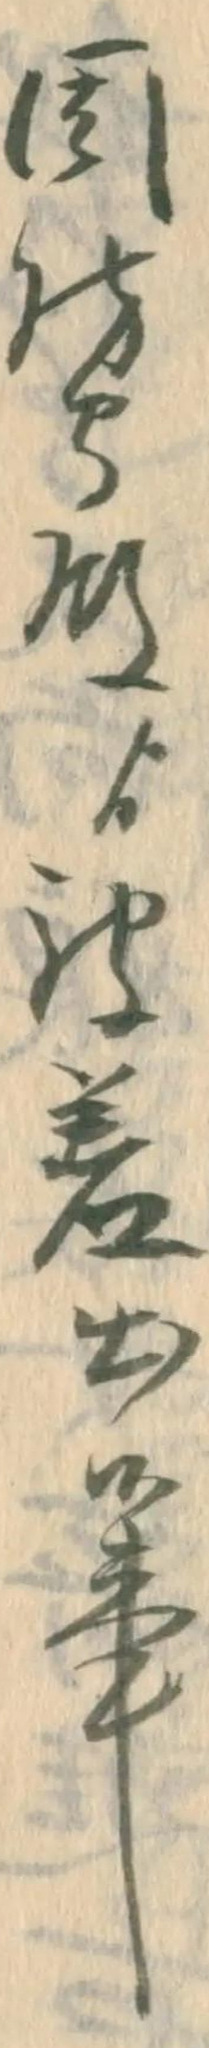周防守殿ゟ被差出候事
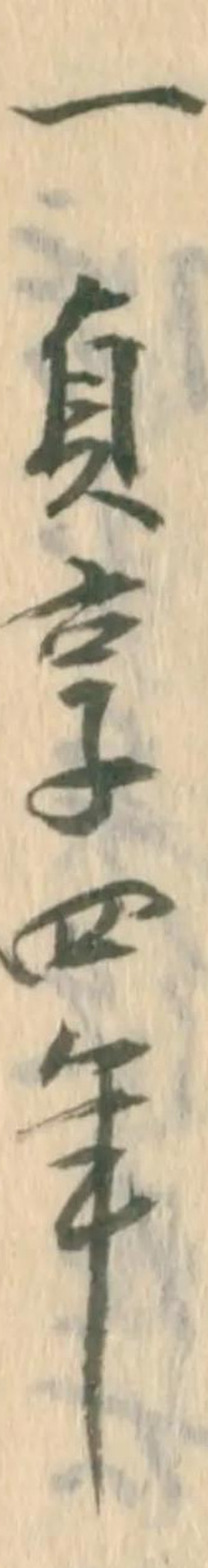一貞享四年

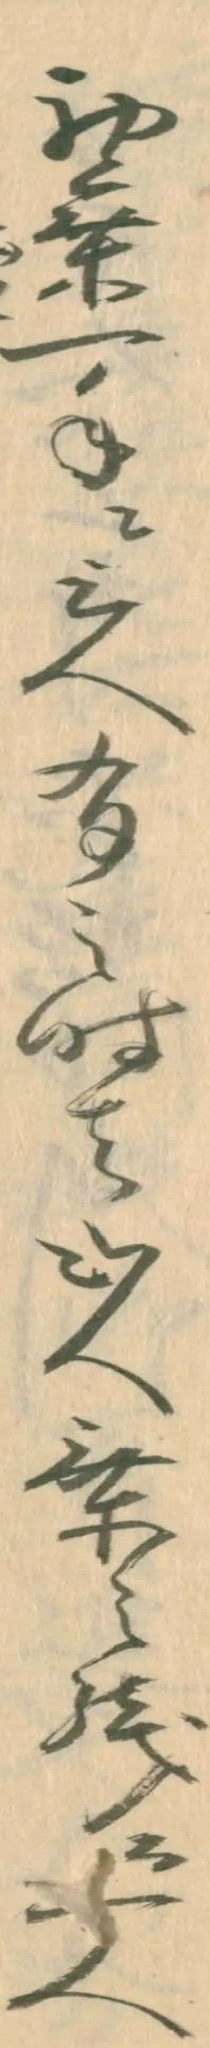一初乗一手ニ三人有之時は弐人乗之残而一人
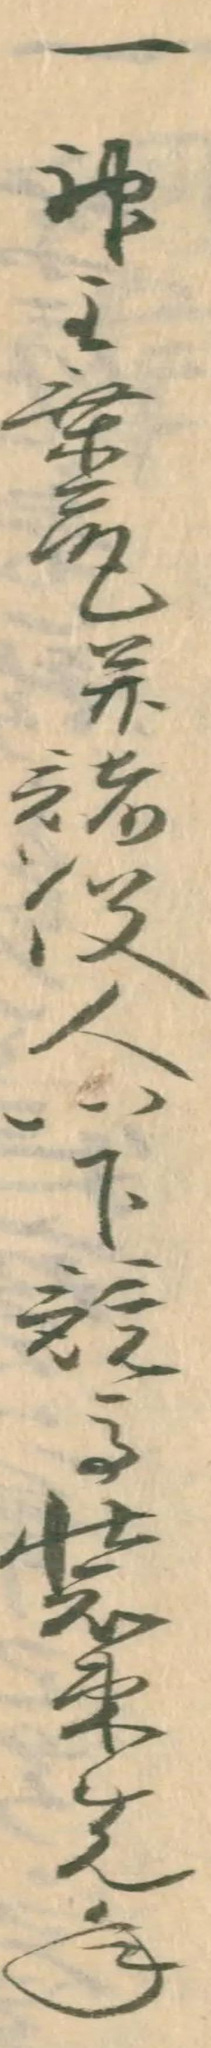一神主乗尻并諸役人以下競馬装束先年
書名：賀茂社記録. 第12冊
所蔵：国立国会図書館 National Diet Library, JAPAN
